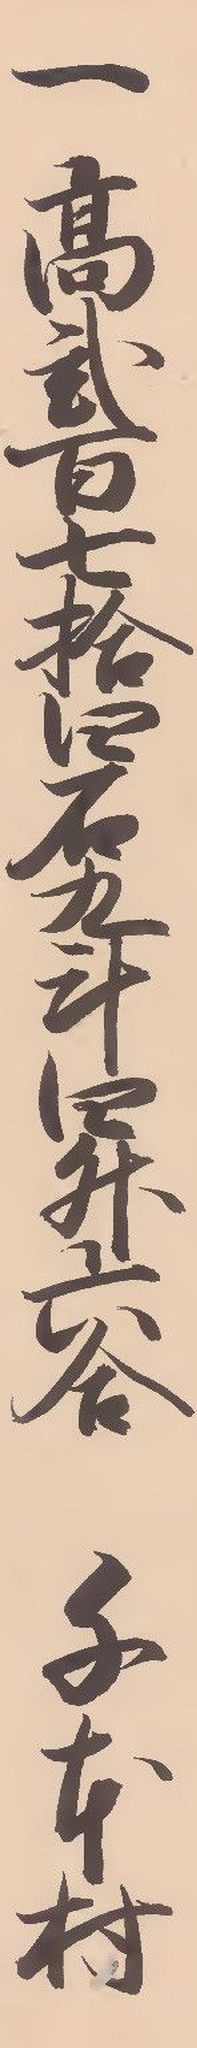一高弐百七拾四石九斗四升六合千本村
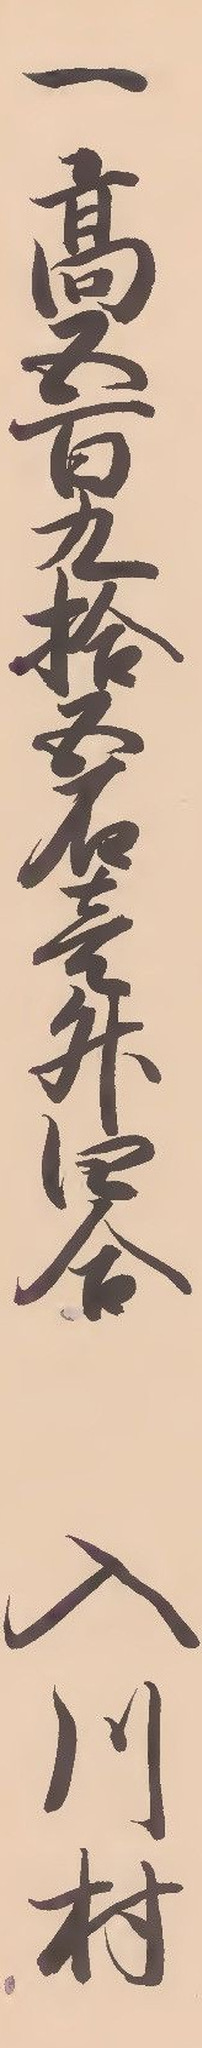一高五百九拾五石壱升四合入川村

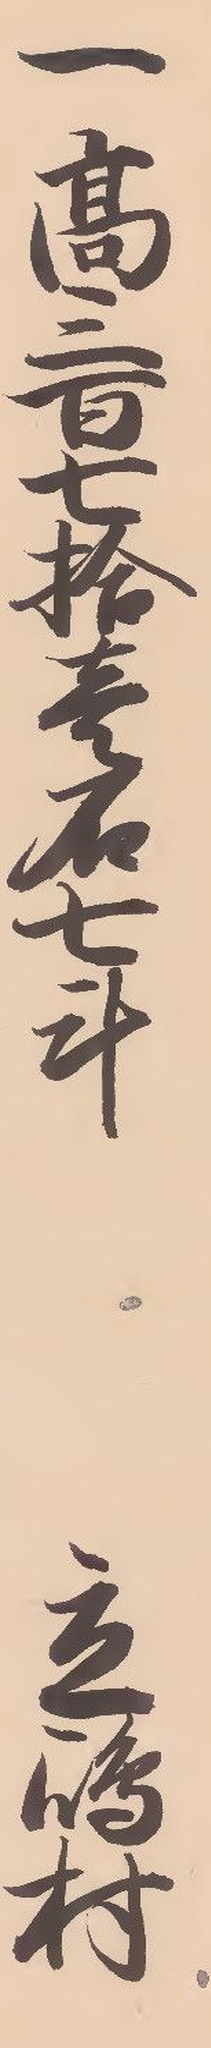一高三百七拾壱石七斗立島村
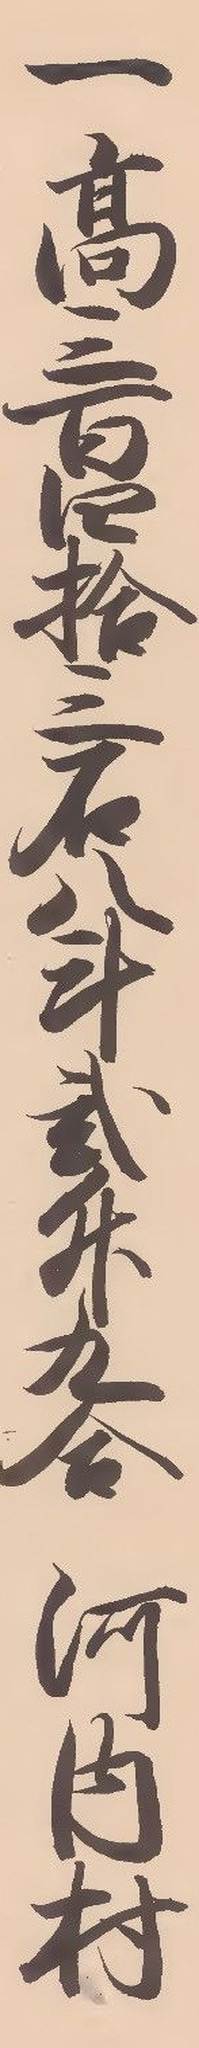一高三百四拾三石八斗弐升九合河内村
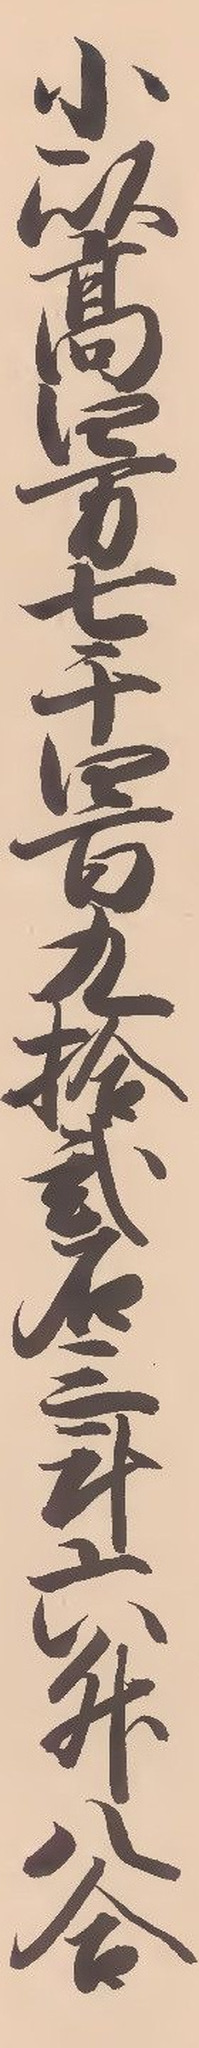小以高四万七千四百九拾弐石三斗六升八合
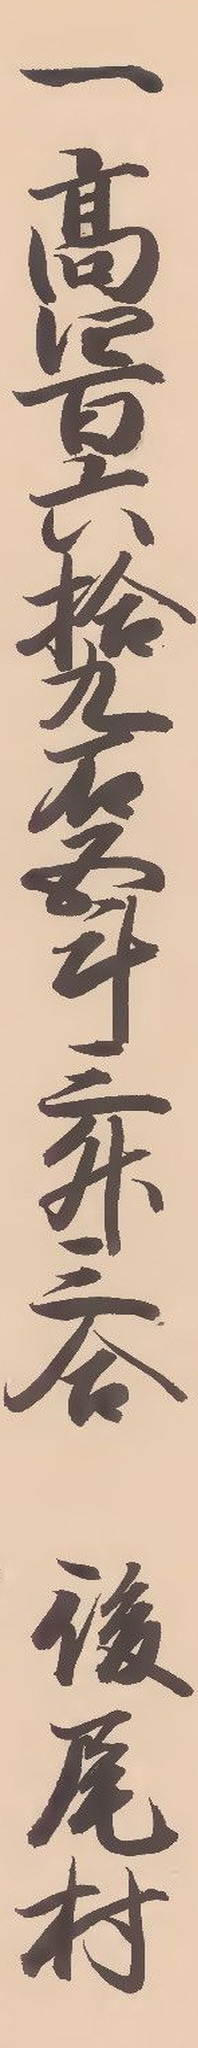一高四百六拾九石五斗三升三合後尾村
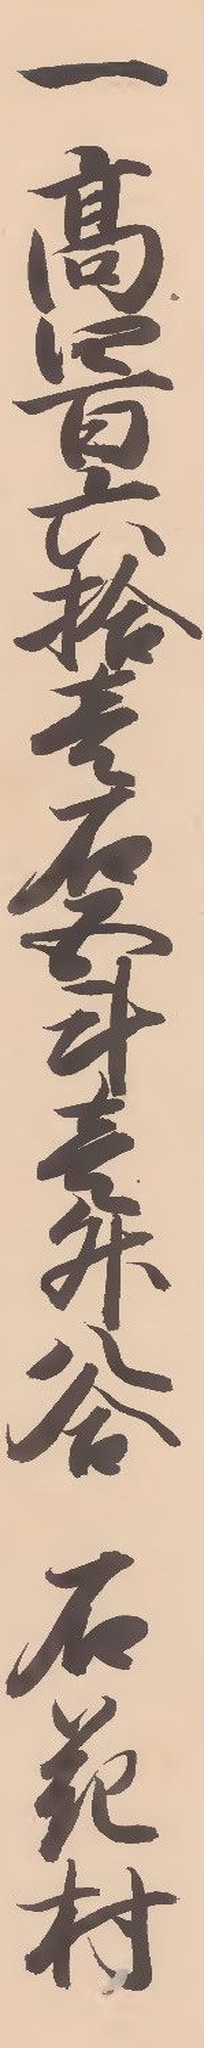一高四百六拾壱石五斗壱升八合石花村
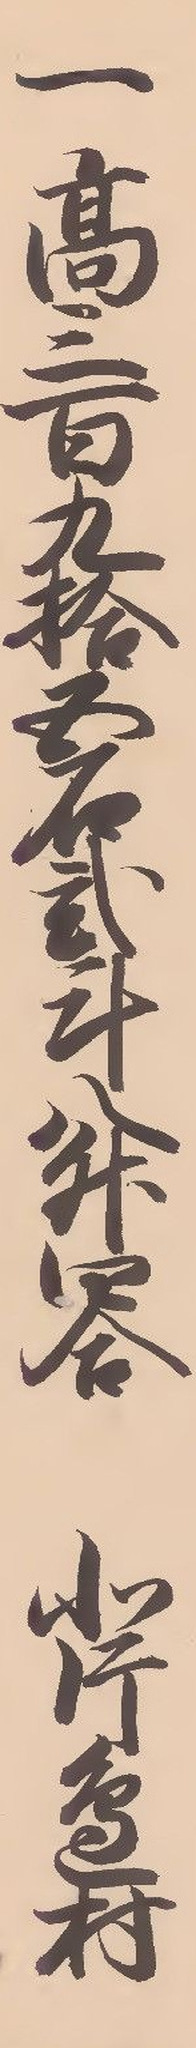一高三百九拾五石弐斗八升四合北片辺村

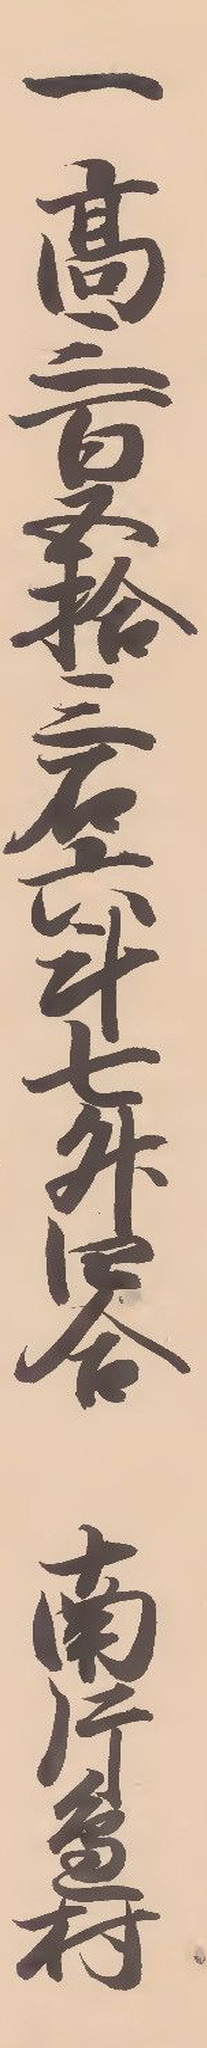一高三百五拾三石六斗七升四合南片辺村
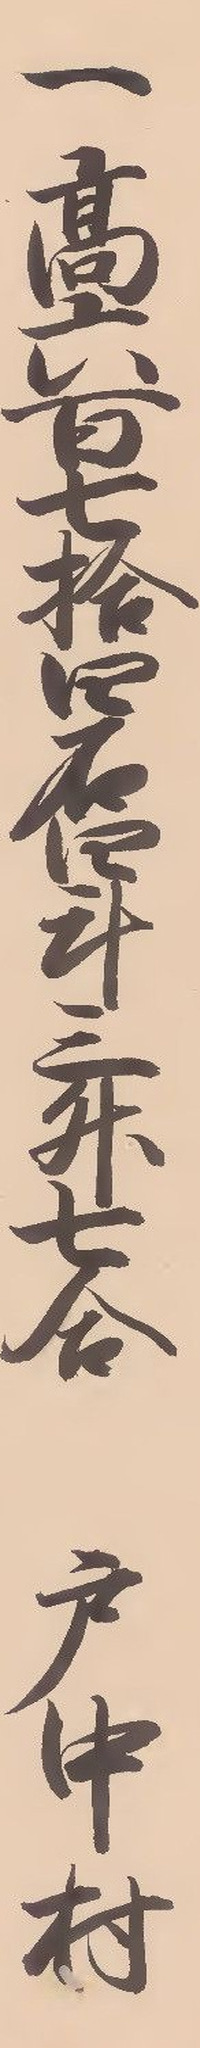一高六百七拾四石四斗三升七合戸中村
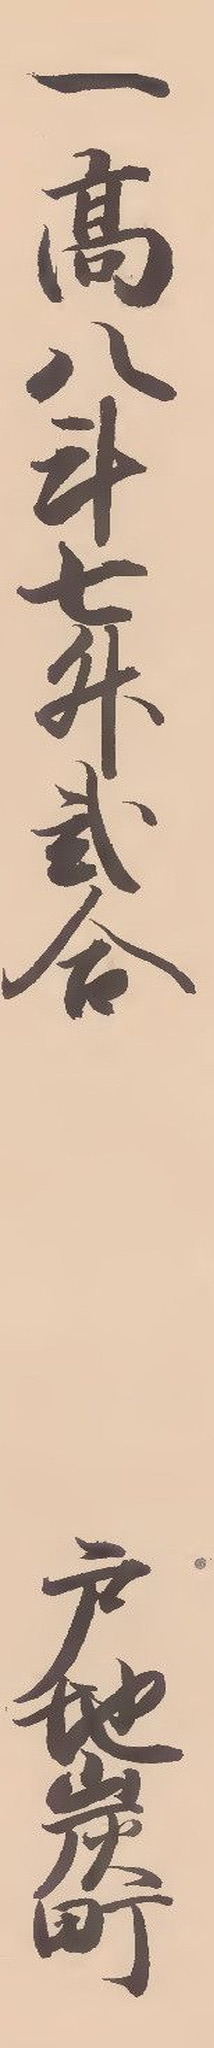一高八斗七升弐合戸地炭町
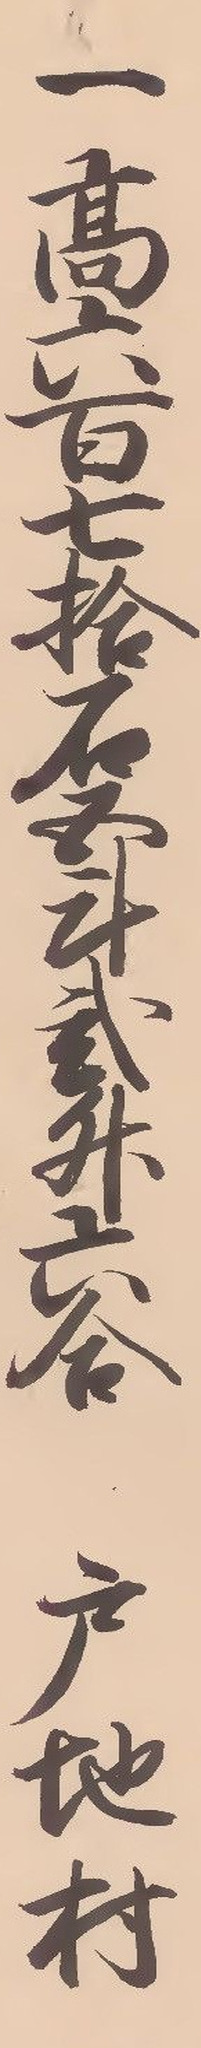一高六百七拾石五斗弐升六合戸地村
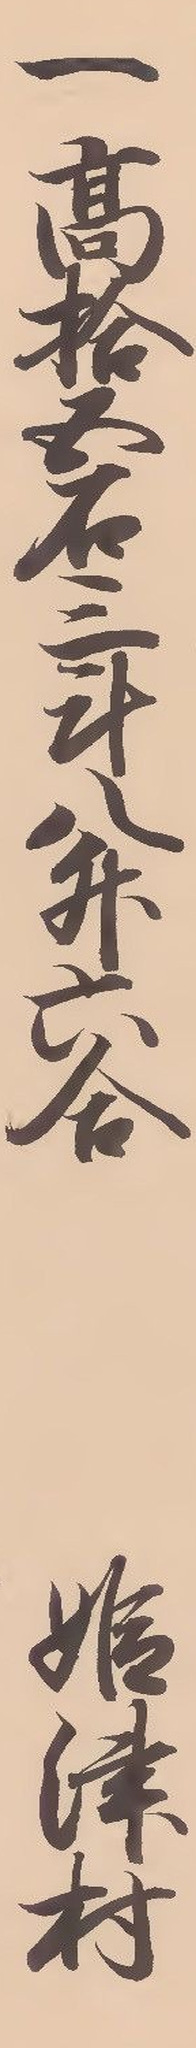一高拾五石三斗八升六合姫津村
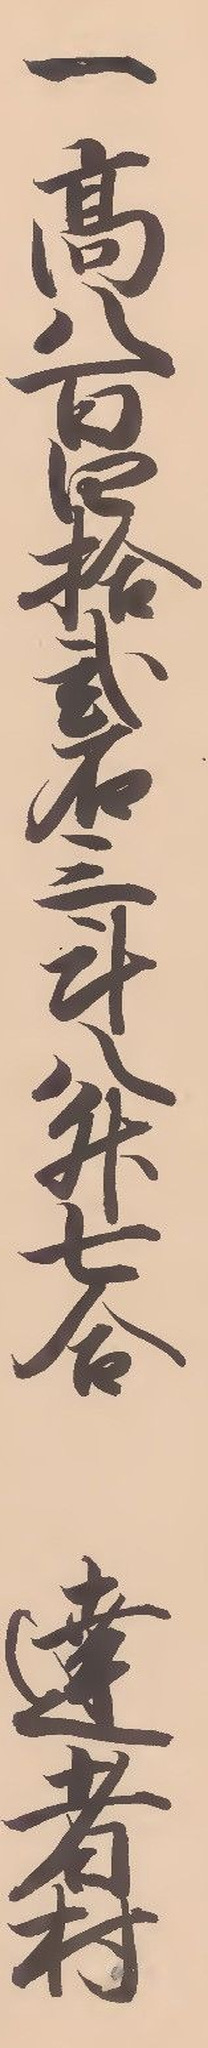一高八百四拾弐石三斗八升七合達者村
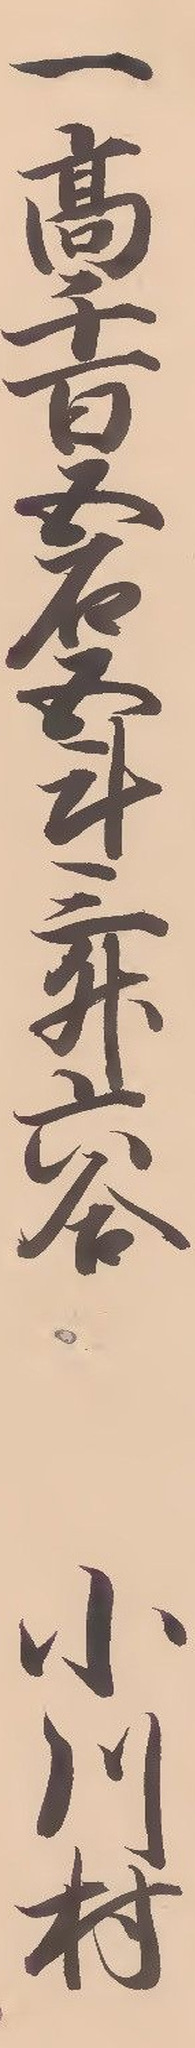一高千百五石五斗三升六合小川村

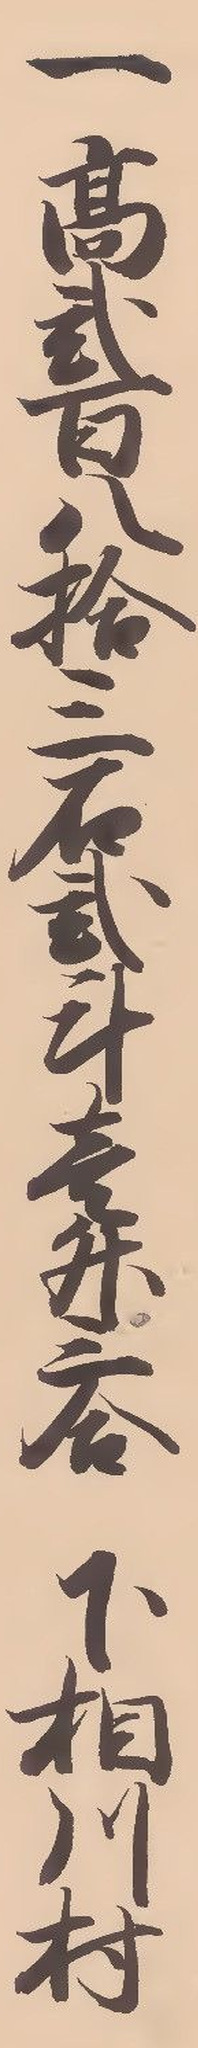一高弐百八拾三石弐斗壱升三合下相川村
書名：佐渡国郷帳
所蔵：国立公文書館 National Archives of Japan
